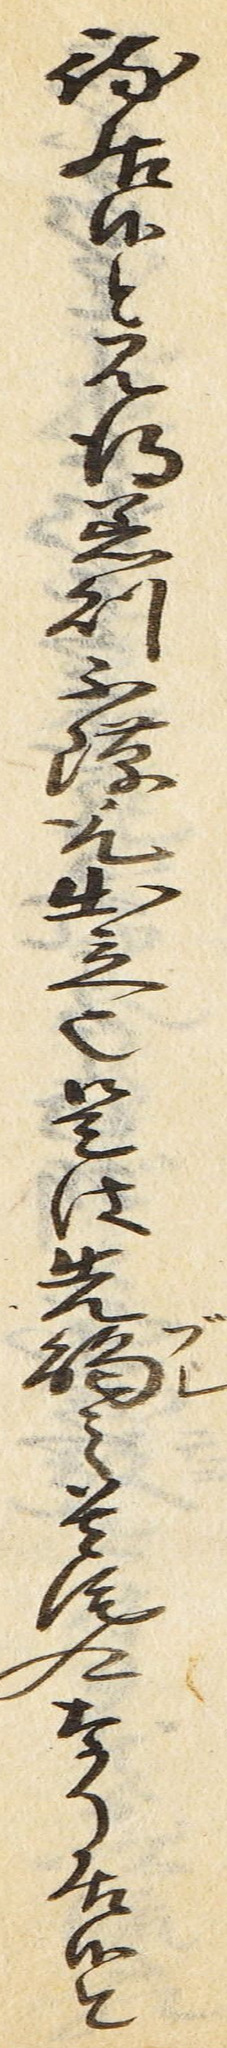待居候と見得着則不隙取出立也是は先触之首尾合なり居候と
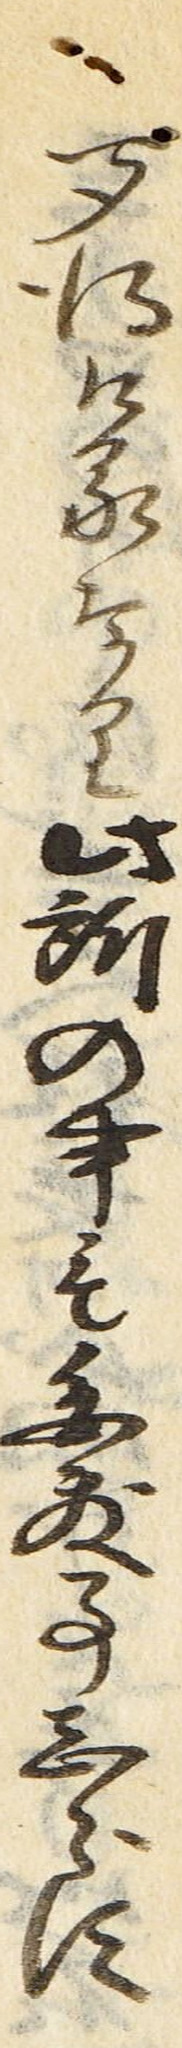聞得けるなり此所の事も委敷事しらす
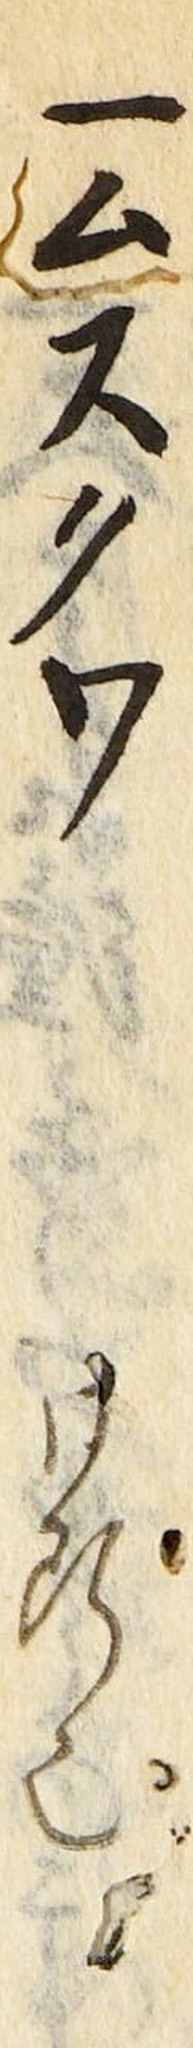一ムスクワ同断也
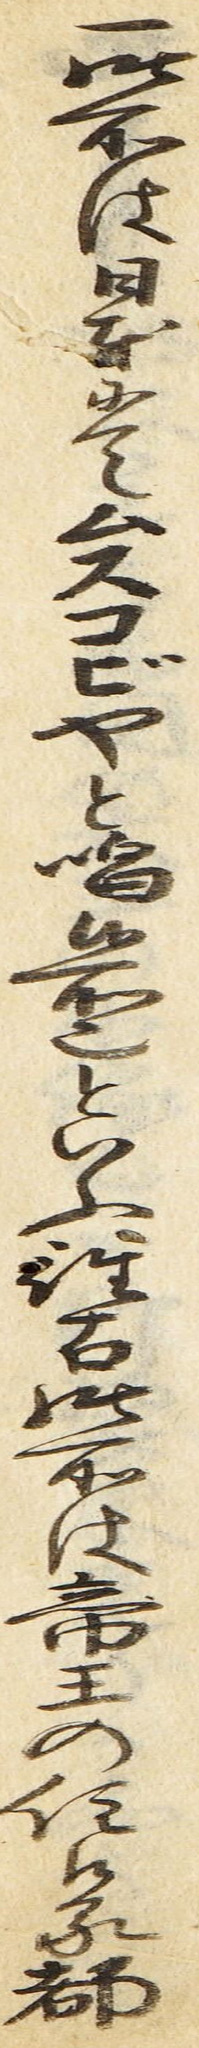一此所は日本にてムスコビヤと唱候所也といふ往古此所は帝王の住ける都
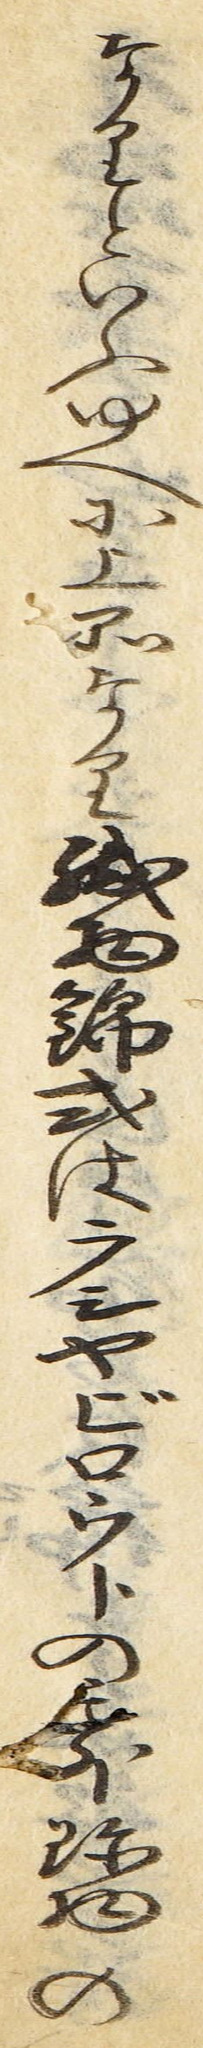なりといふゆへに上品なり織物錦或はラシヤビロウトの外珍物の

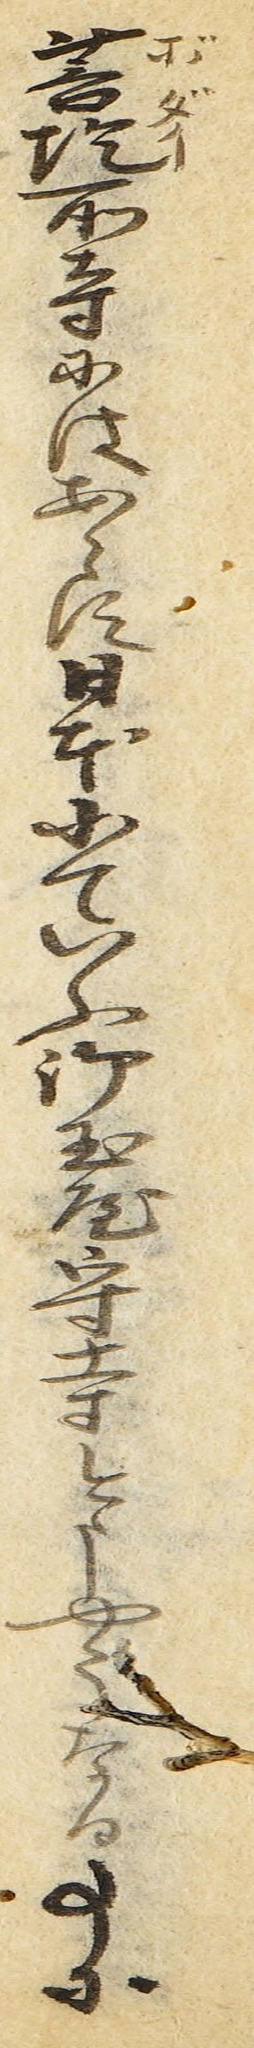菩提所寺にはあらす日本にていふ御玉屋守寺と申やうなる事に
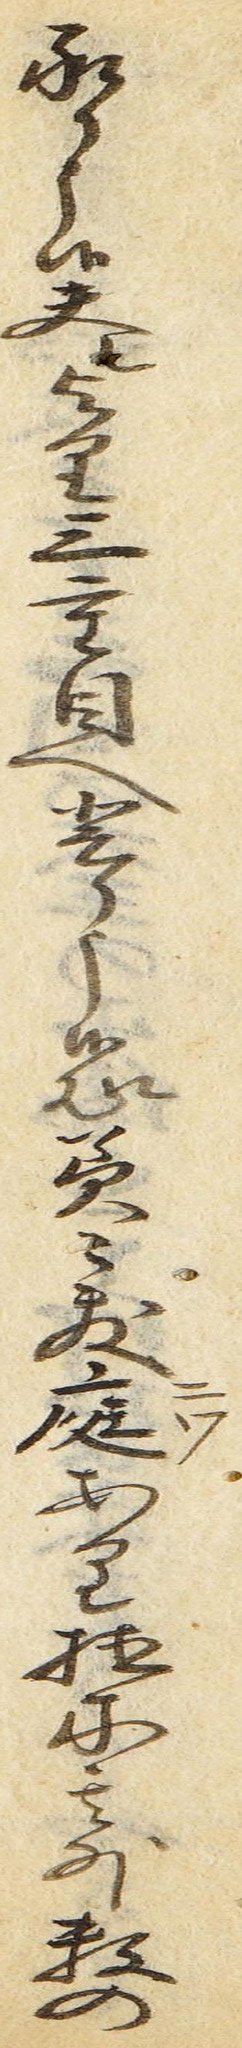承りし候夫れより参重目へ登り申候処美々敷庭あり植木其外数の
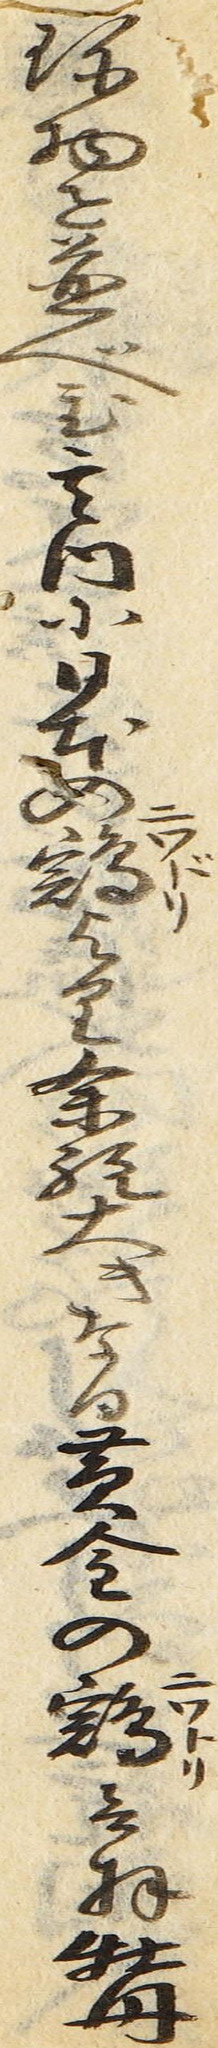珍物を並べ置其内に日本の鶏より余程大きなる黄金の鶏壱羽牡丹
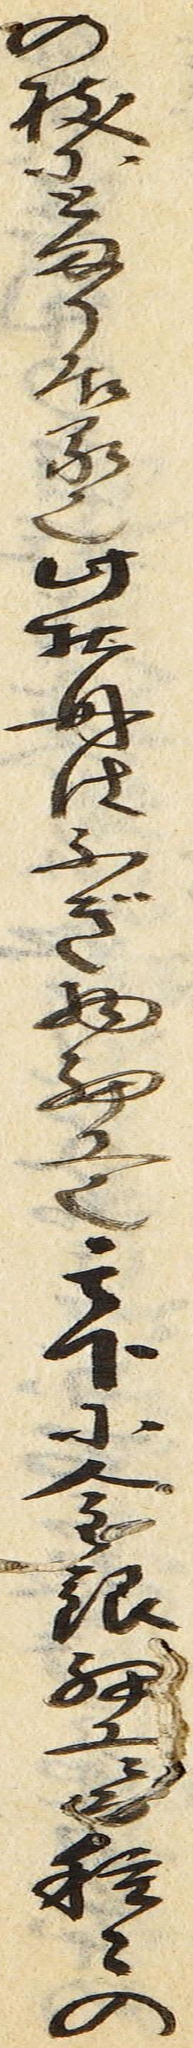の枝にとまり居る也此牡丹はふぎ物細工也其下に金銀細工に而種々の
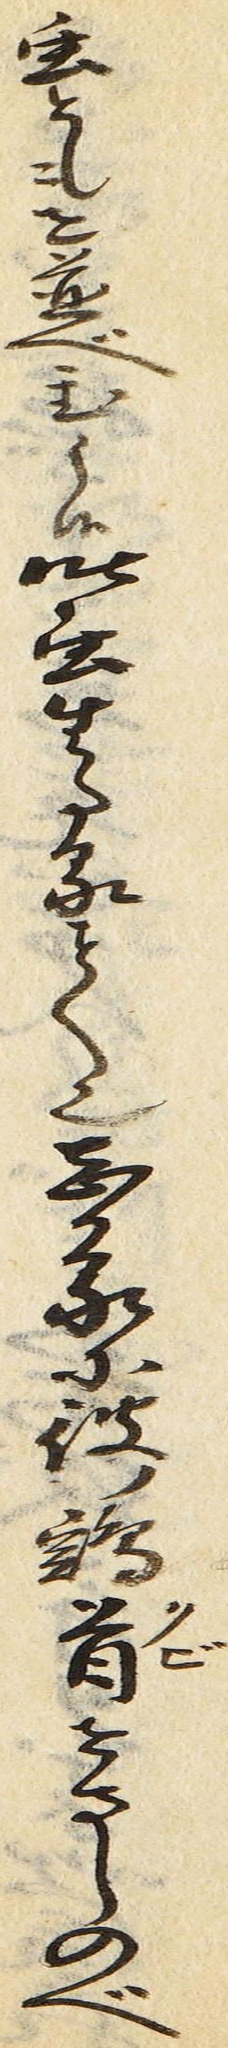虫ともを並べ置申し候此虫生ることく也しかるに彼ノ鶏首をさしのべ
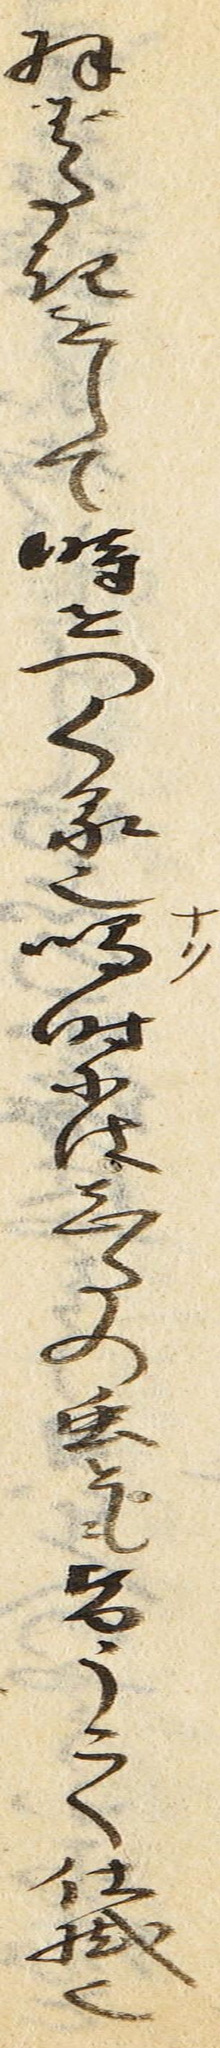羽ばたきをして時をつくる也鳴時にはしたの虫とも皆うこく仕掛也
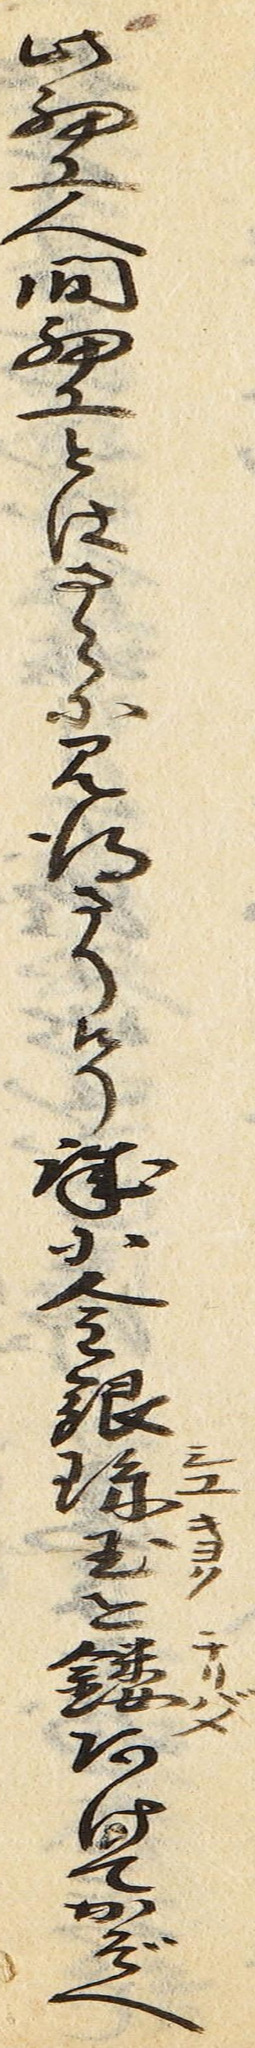此細工人間細工とはさらに見得さりけり誠に金銀珠玉を鏤あけてかぞへ
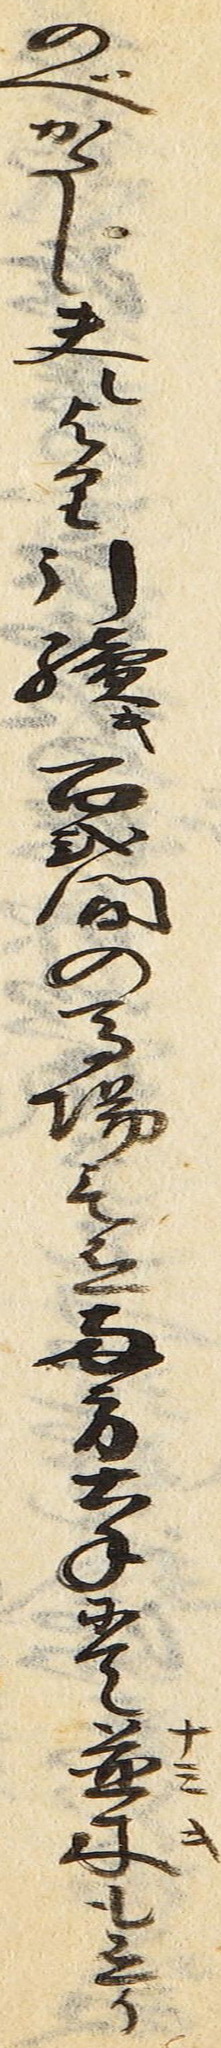のべかたし夫れより引続き百弐間の馬場まこも有両方土手にて並木も有り
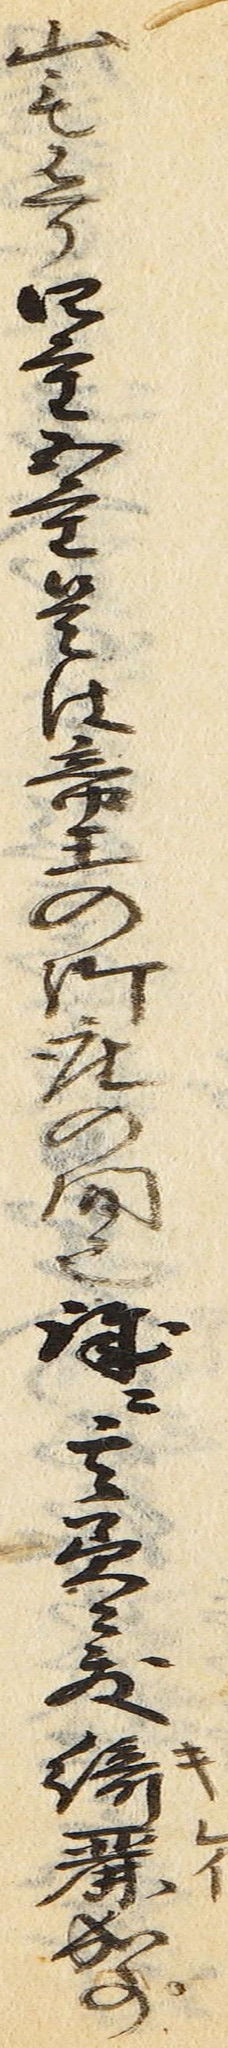山も有り四重五重是は帝王の御座の間也誠に其美々敷綺麗成事
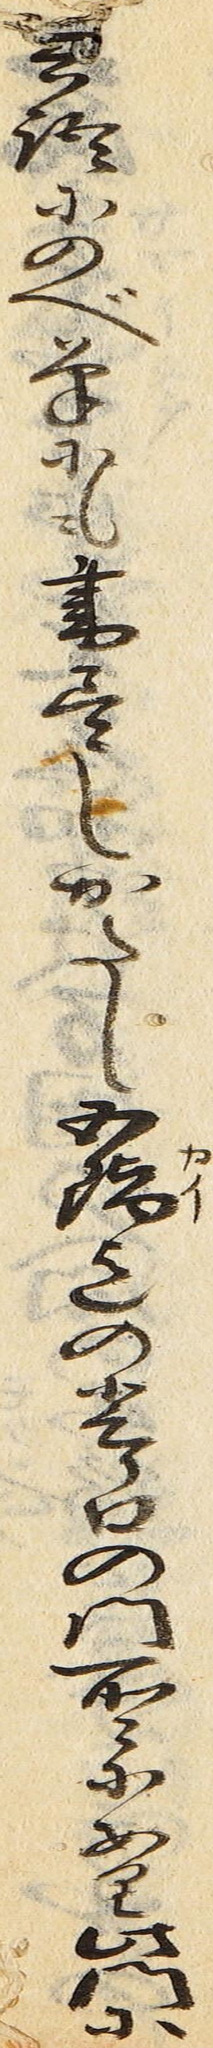言語にのべ筆にも書尽しかたし五階迄のｎ登り口の門前々にあり此門に
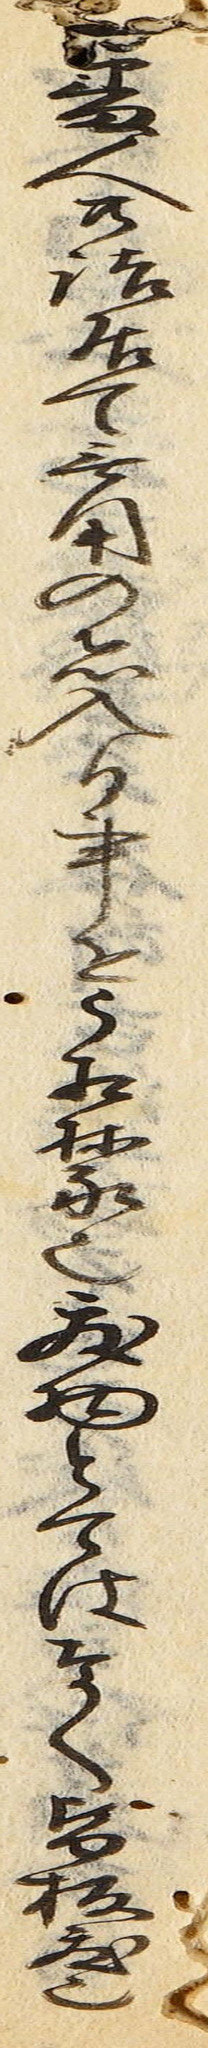番人共詰居て無用の者入る事を被相禁也敷物とてはなく皆板敷也
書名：外国漂流記
